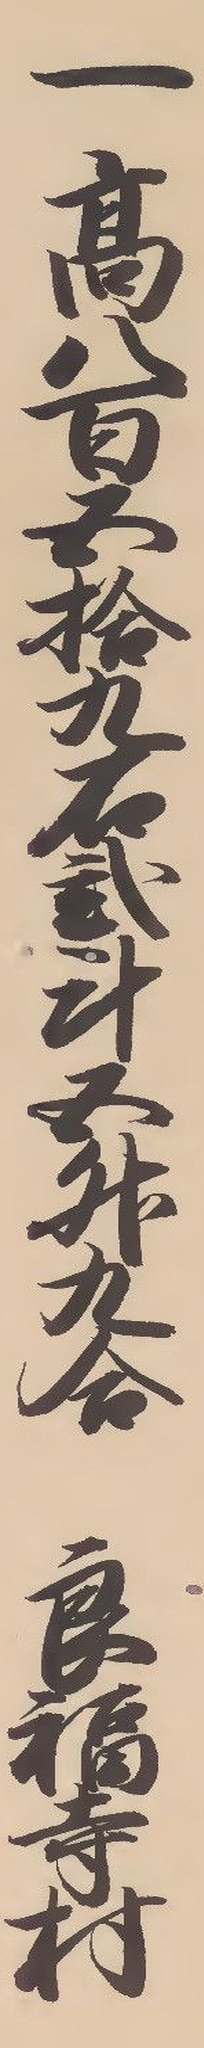一高八百五拾九石弐斗五升九合良福寺村
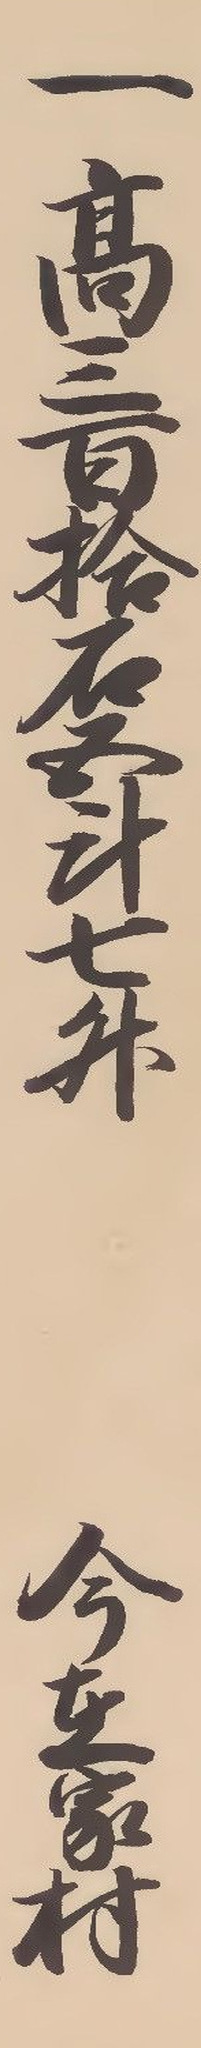一高三百拾石五斗七升今在家村
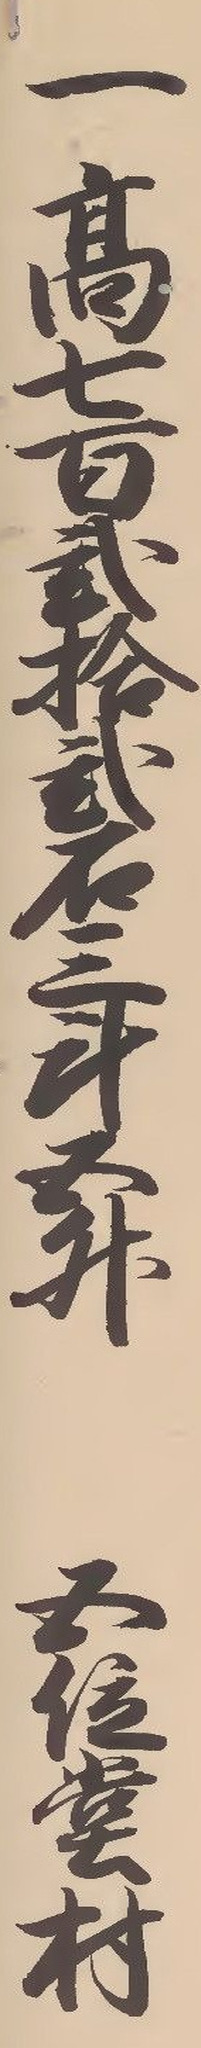一高七百弐拾弐石三斗五升五位堂村
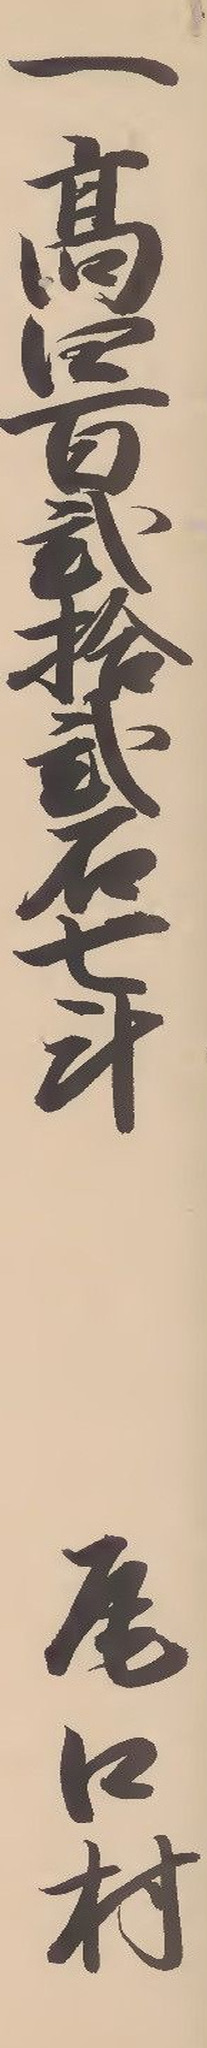一高四百弐拾弐石七斗瓦口村
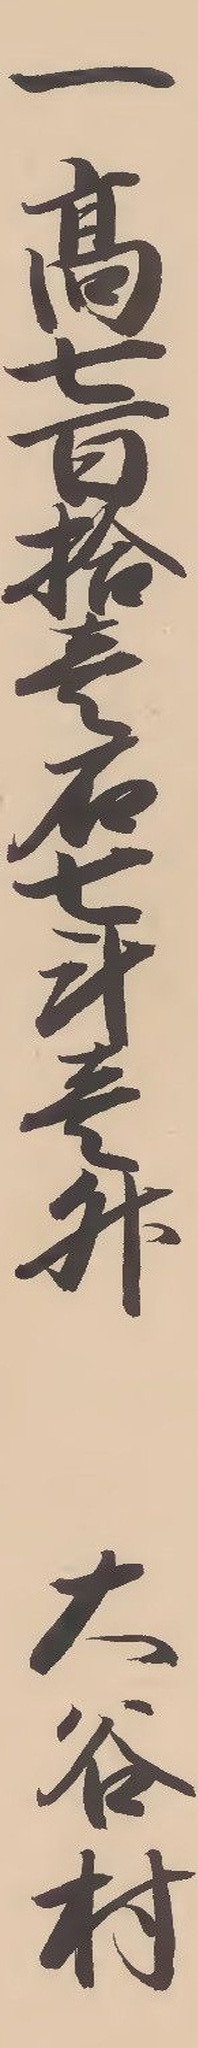一高七百拾壱石七斗壱升大谷村

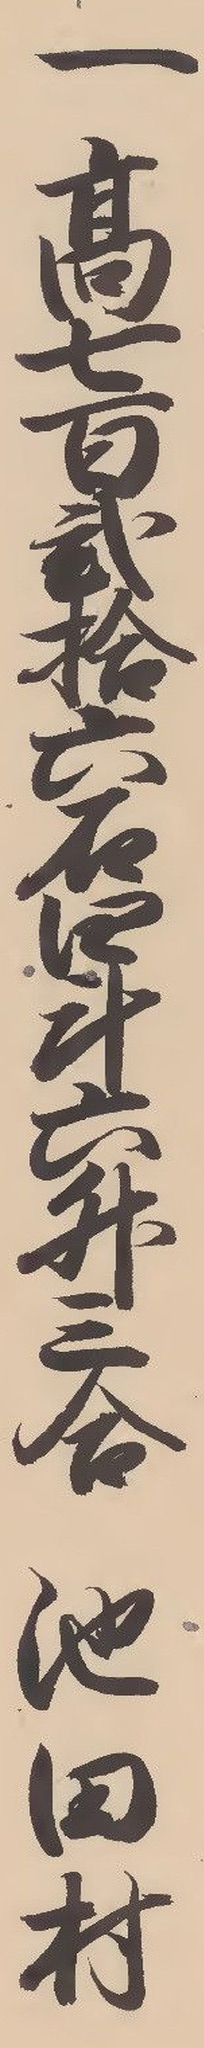一高七百弐拾六石四斗六升三合池田村
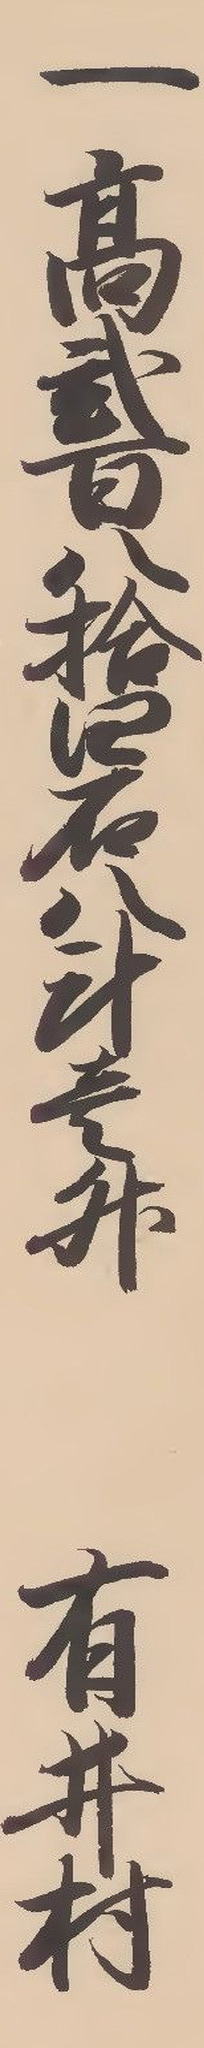一高弐百八拾四石八斗壱升有井村
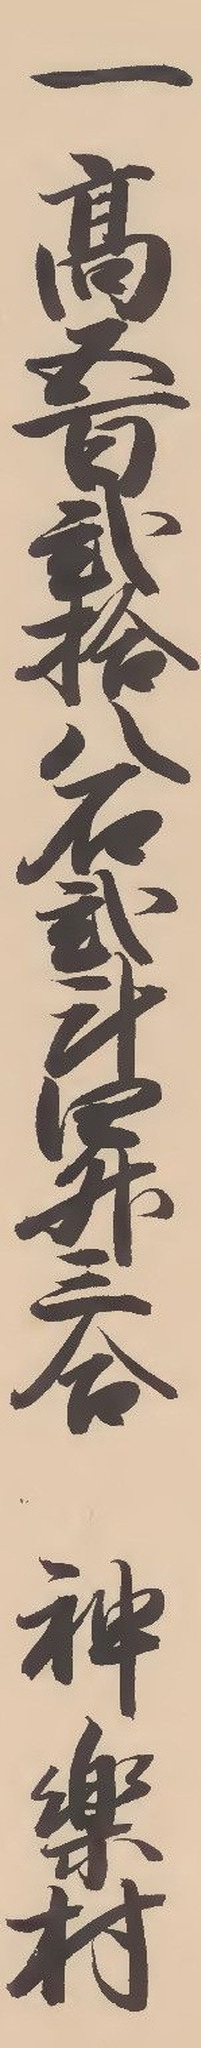一高五百弐拾八石弐斗四升三合神楽村
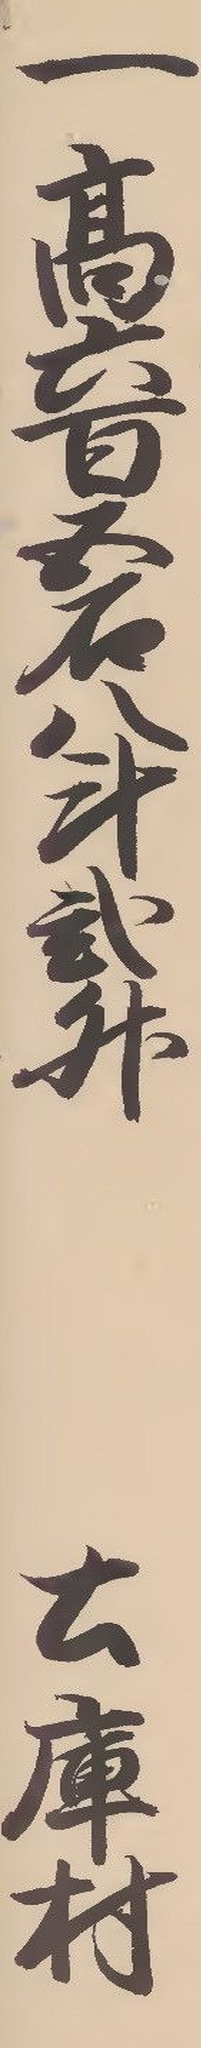一高六百五石八斗弐升土庫村
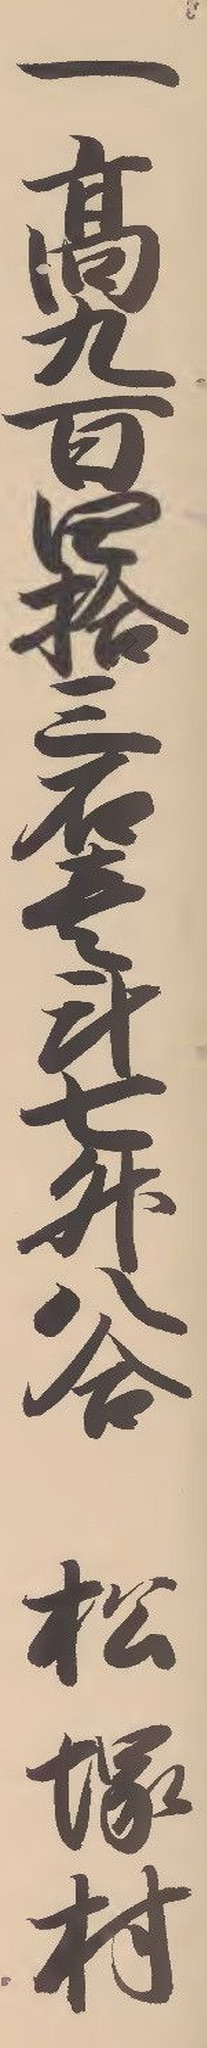一高九百四拾三石壱斗七升八合松塚村
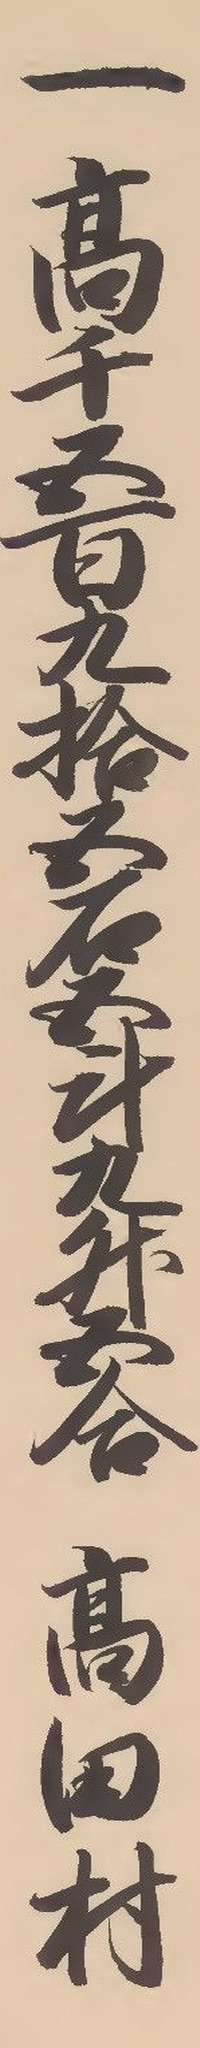一高千五百九拾五石五斗九升五合高田村
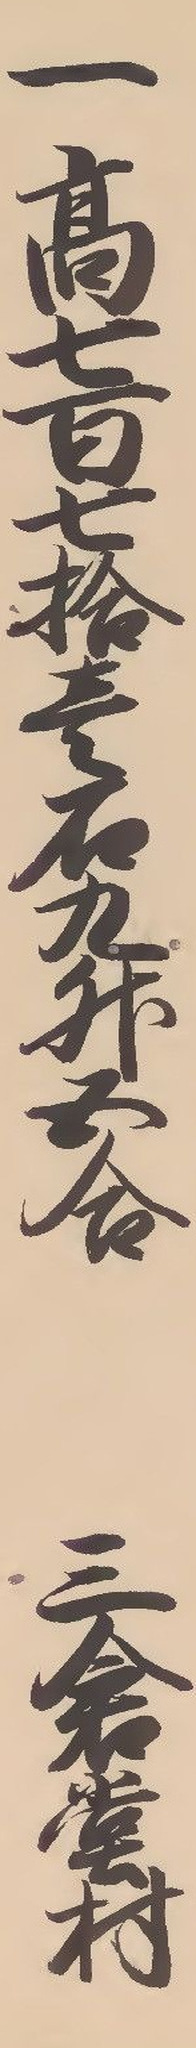一高七百七拾壱石九升五合三倉堂村

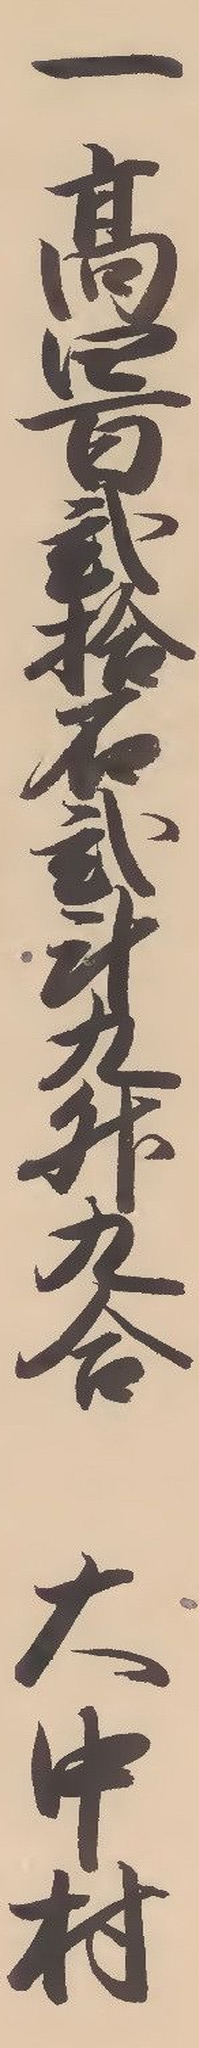一高四百弐拾石弐斗九升九合大中村
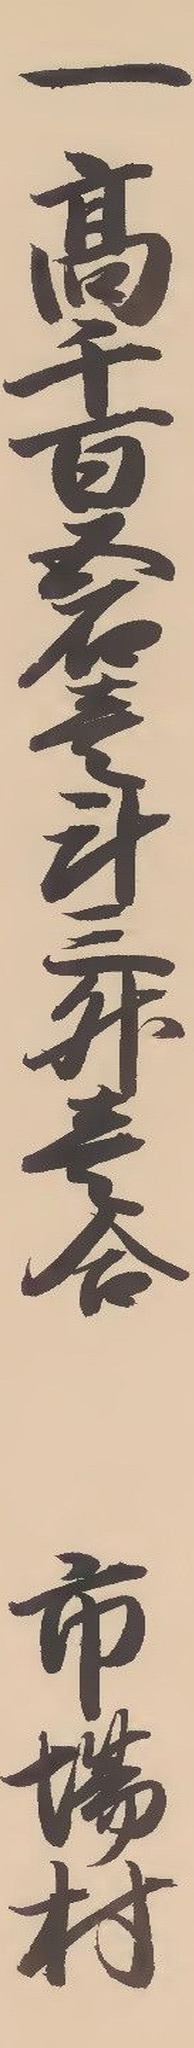一高千百五石壱斗三升壱合市場村
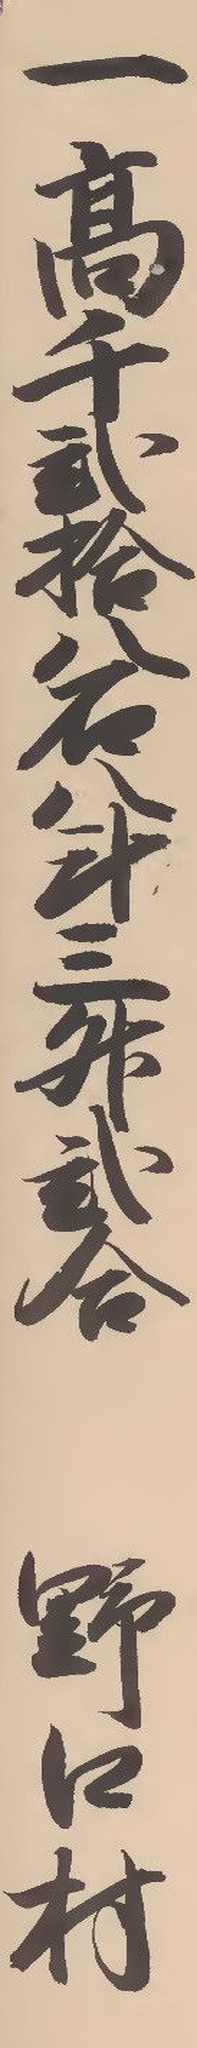一高千弐拾八石八斗三升弐合野口村
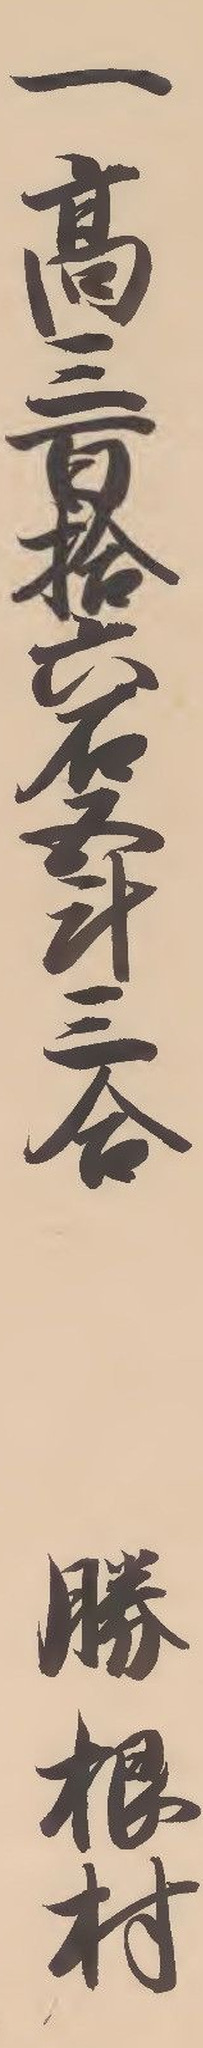一高三百拾六石五斗三合勝根村
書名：大和国郷帳
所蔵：国立公文書館 National Archives of Japan
